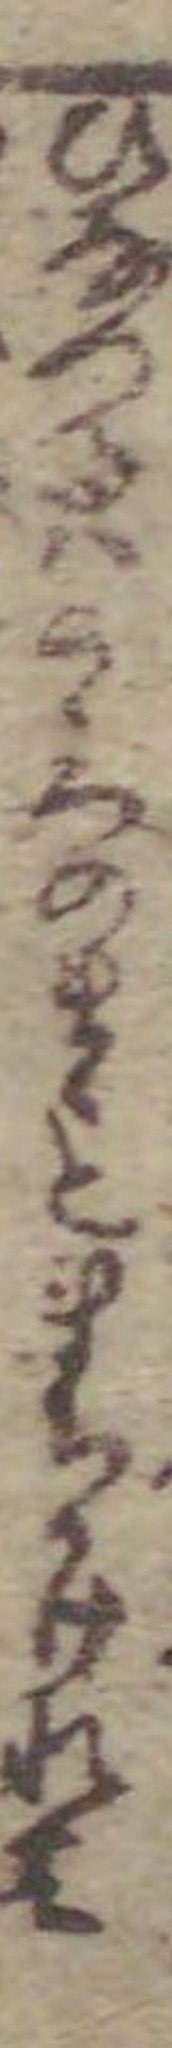ひなつるハこゝろのまゝとまちけれは
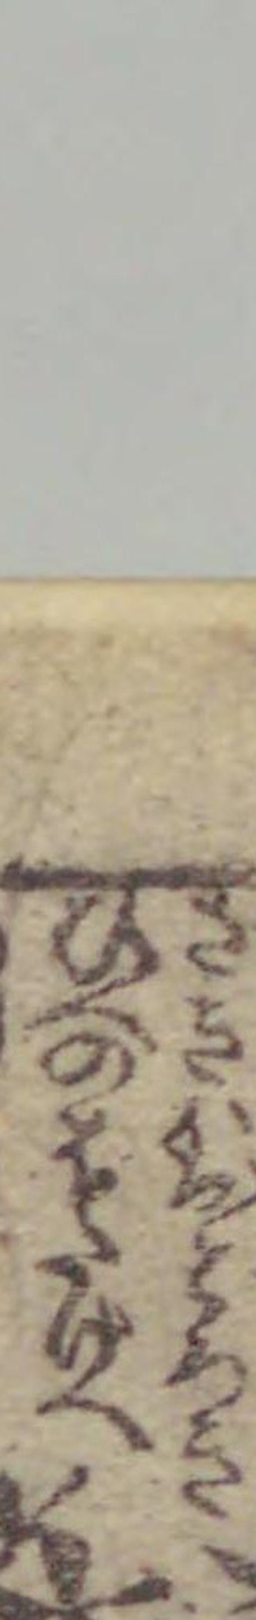ひへのはたけへ
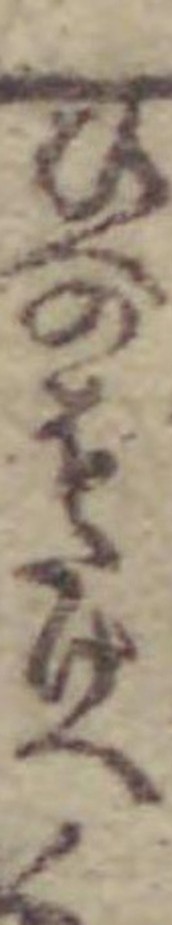ひへのはたけへ
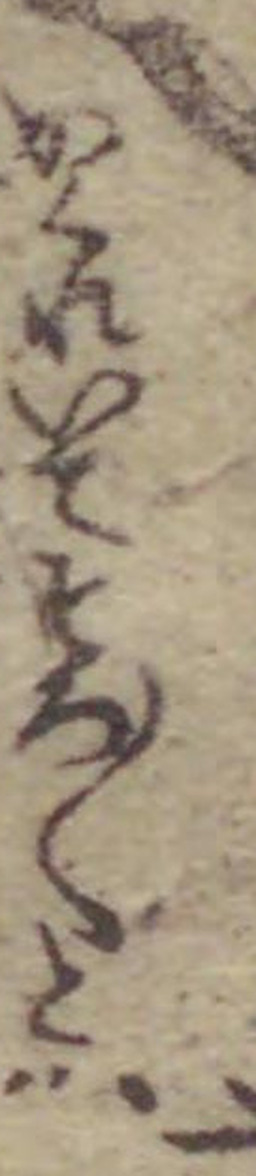かくれていてそろ〳〵と
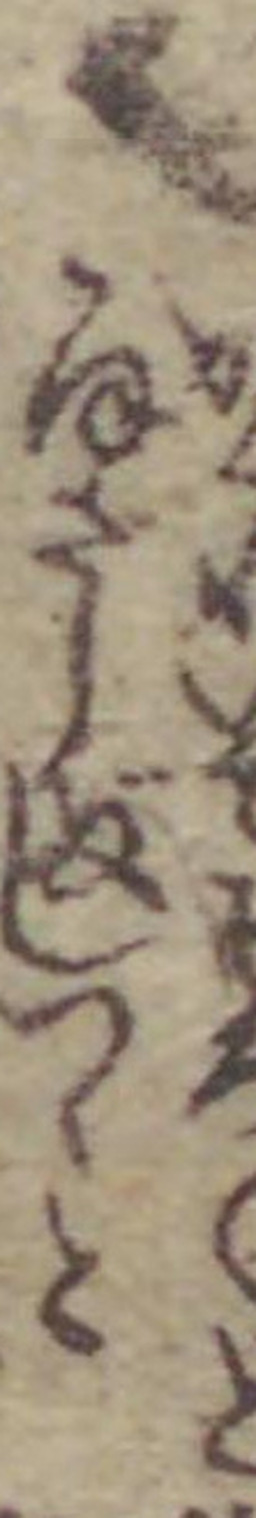かほさしだしつゝと
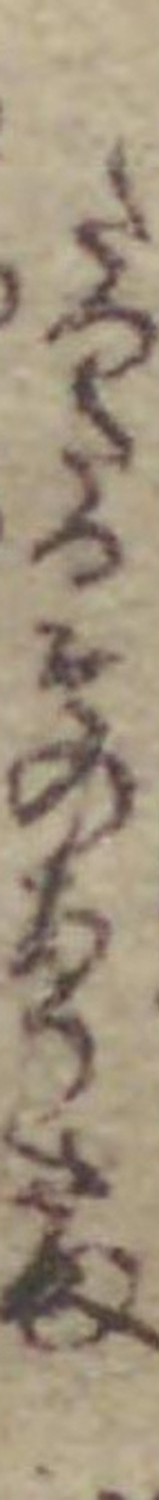たつたるそのありさま
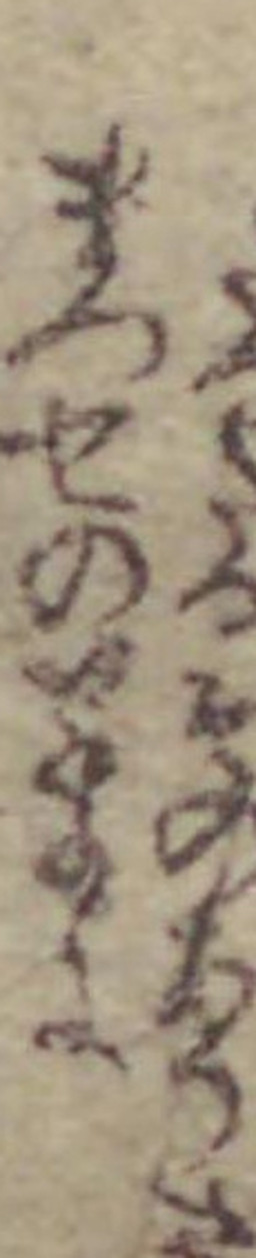まつせのいまに
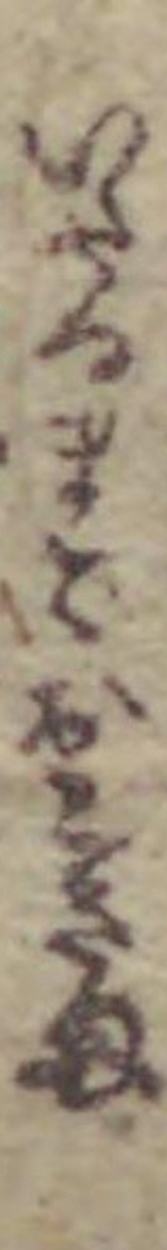いたるまておこさま
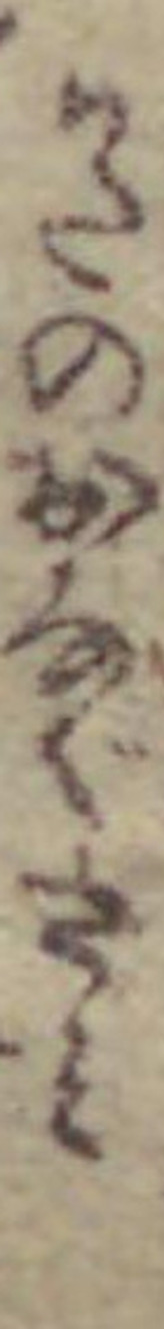かたのおなぐさミ
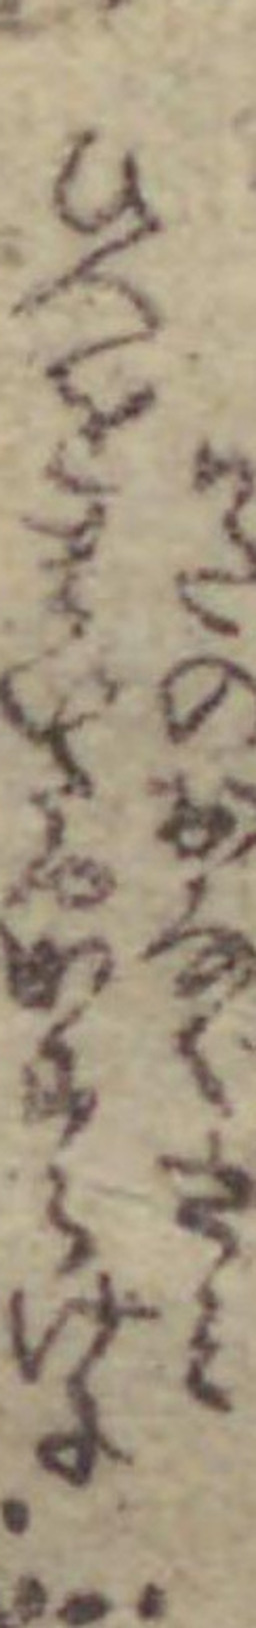ひへをまいたるかわらけに
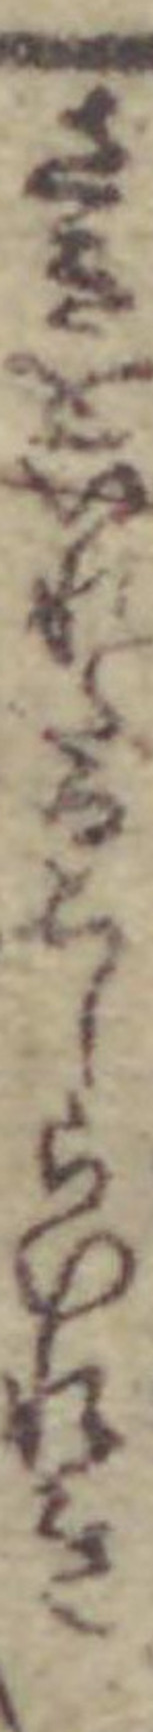さきをいれたるこしらいれき
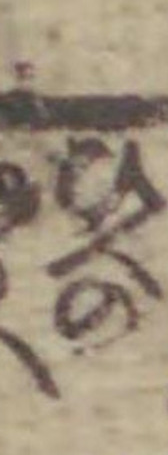ひへの
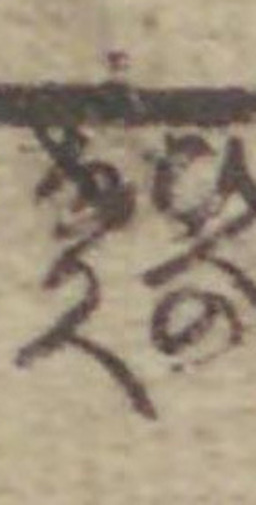なかへ
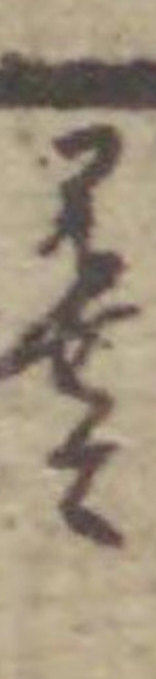見せて
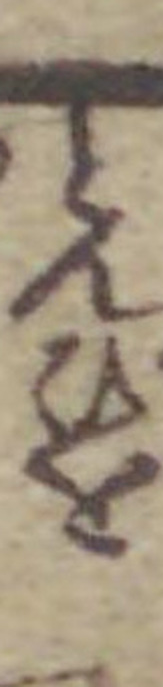とんひを
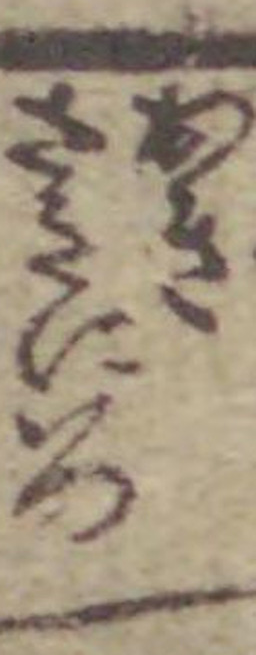さきにいつ
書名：烏行水諺草 3巻
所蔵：国立国会図書館 National Diet Library, JAPAN
